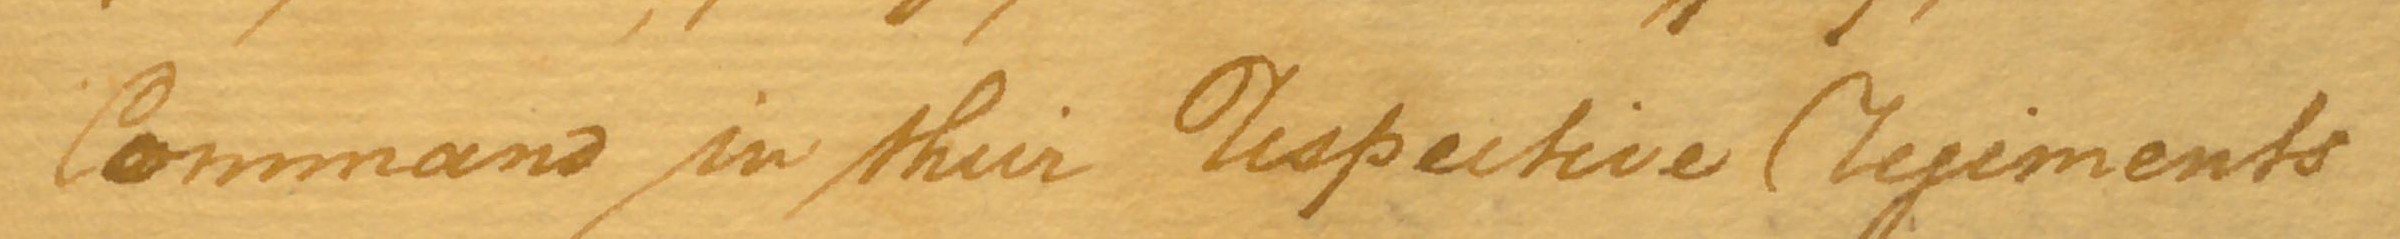Command in their respective regiments
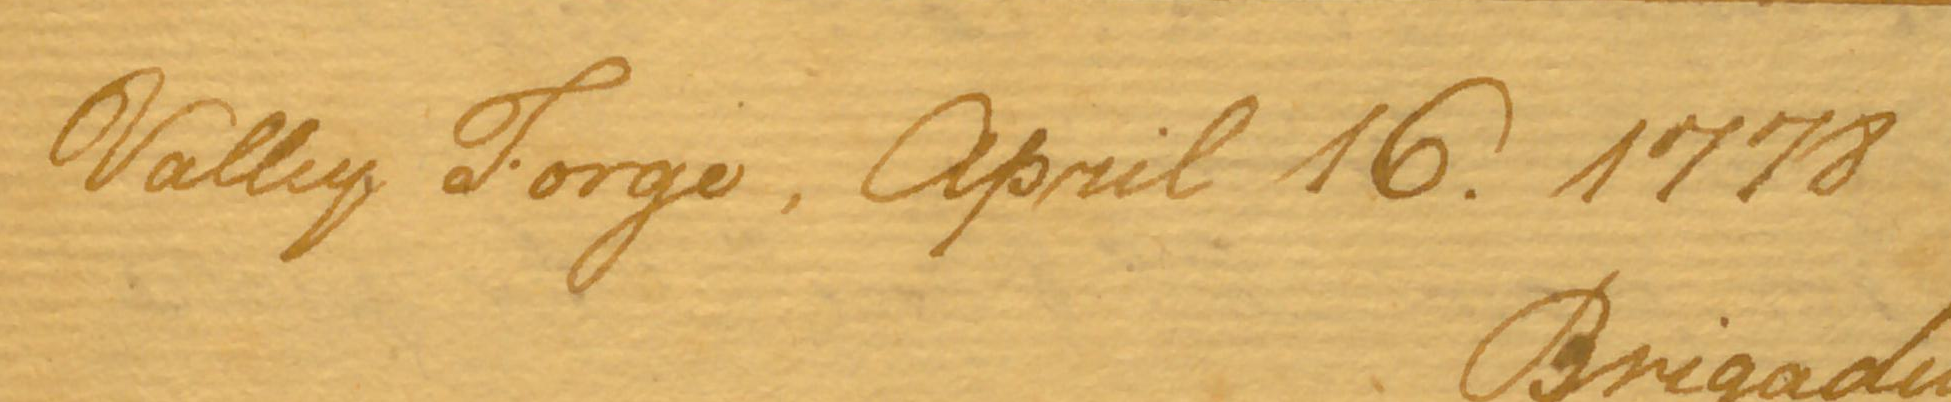Valley Forge, April 16. 1778
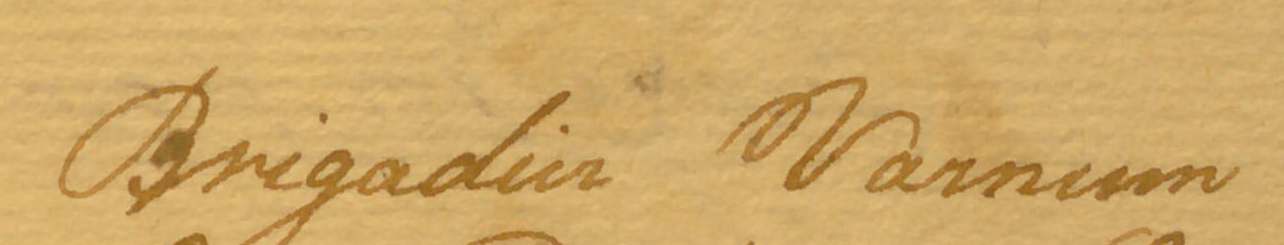Brigadier Varnum
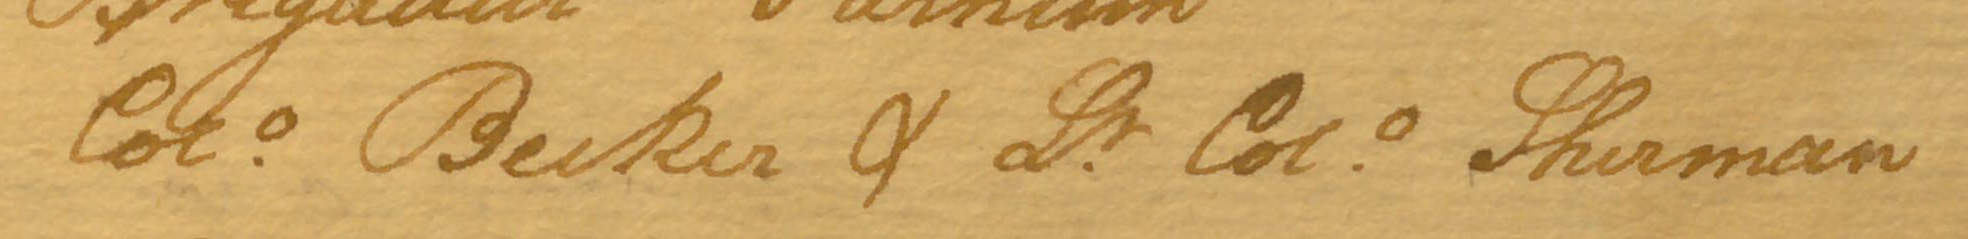Col^o. Beiker & L^t. Col^o. Sherman
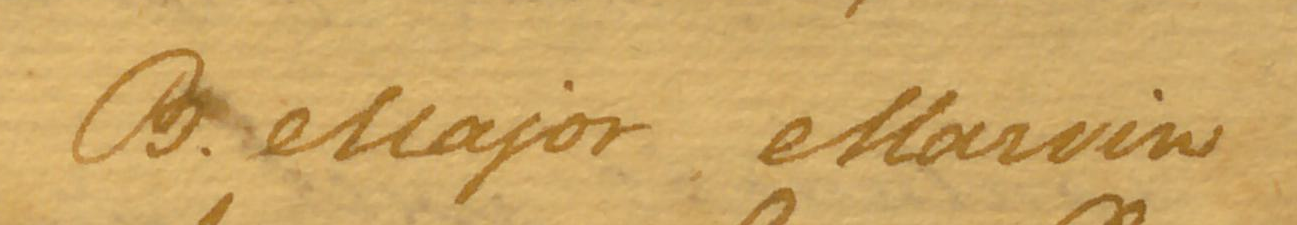B. Major Marvin
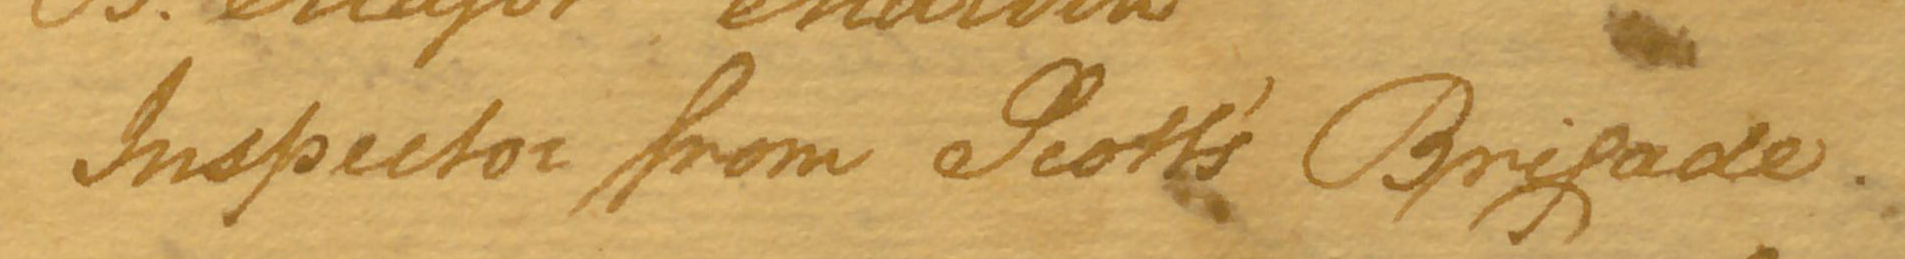Inspector from Scott's Brigade.
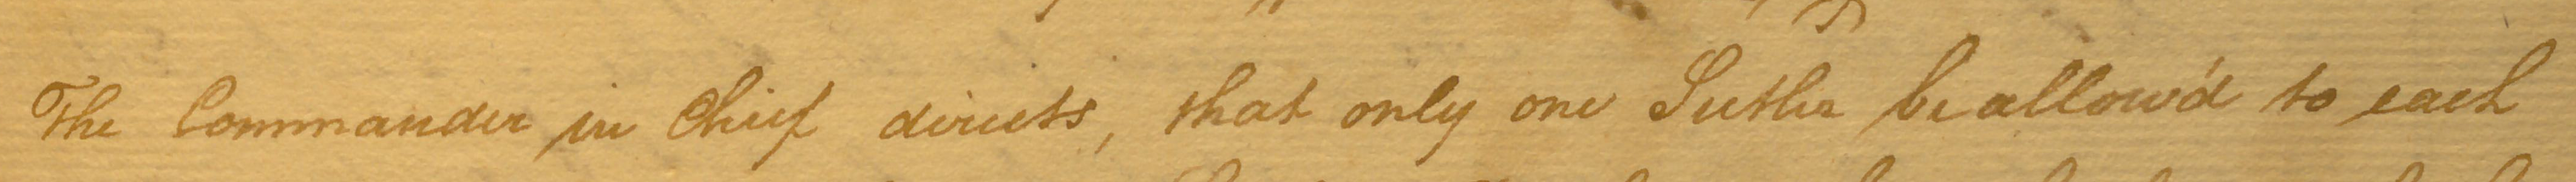The Commander in Chief directs, that only one Suthe be allow'd to each
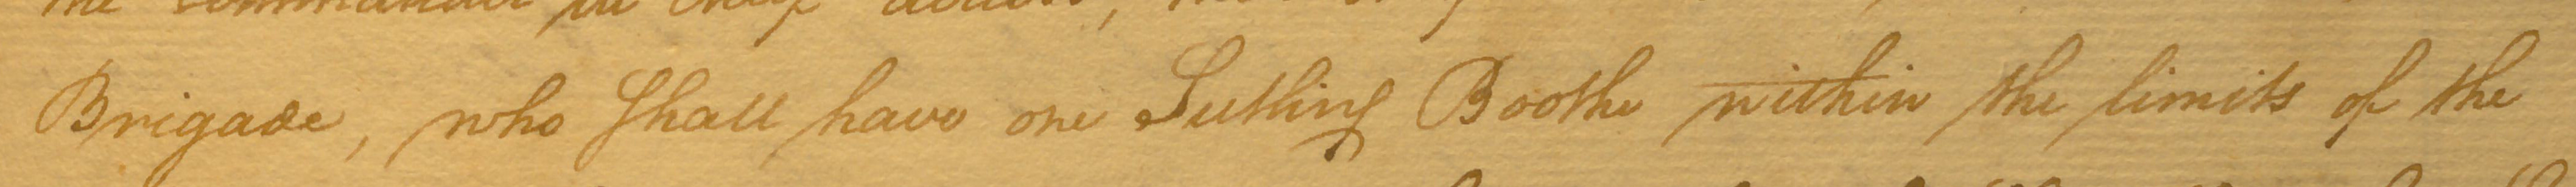Brigade, who shall have one Suthing Boothe within the limits of the
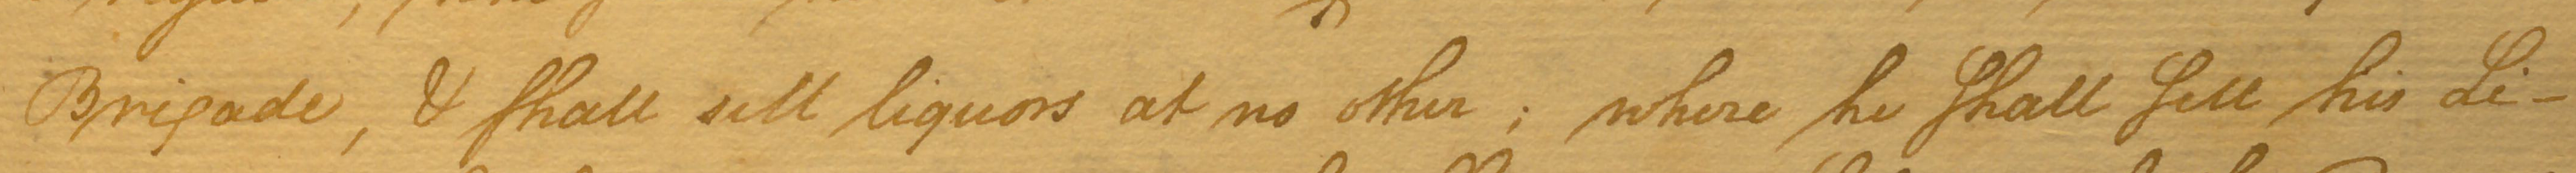Brigade, & shall sell liquors at no other; where he shall sell his Li-
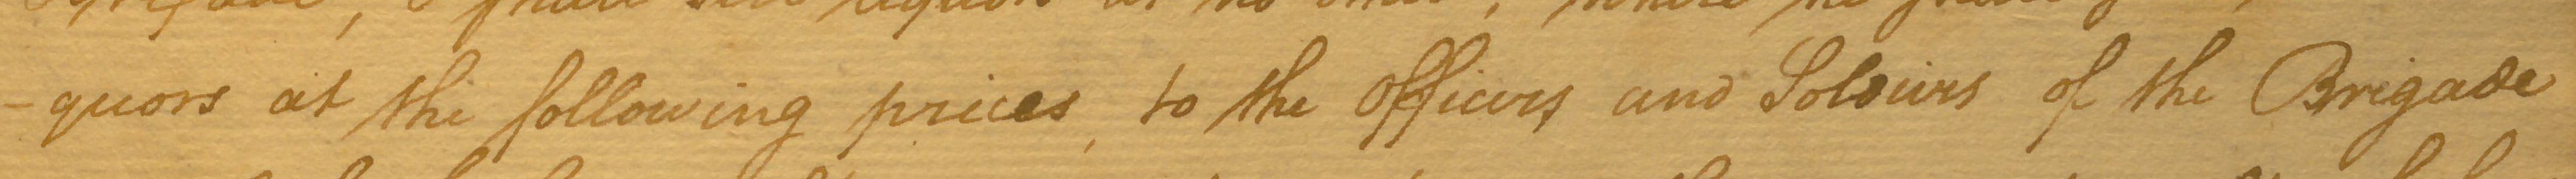-quors at the following prices to the officers and Soldiers of the Brigade
